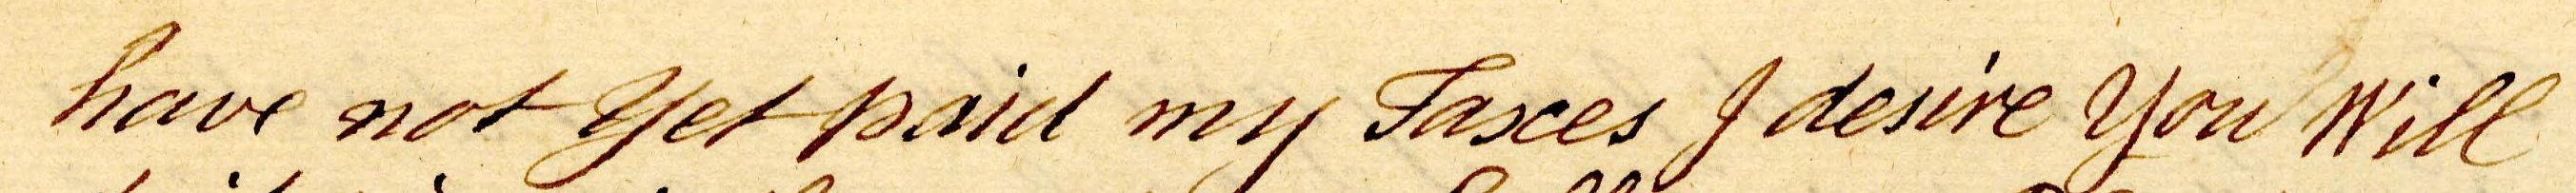have not Yet paid my Taxes I desire You Will
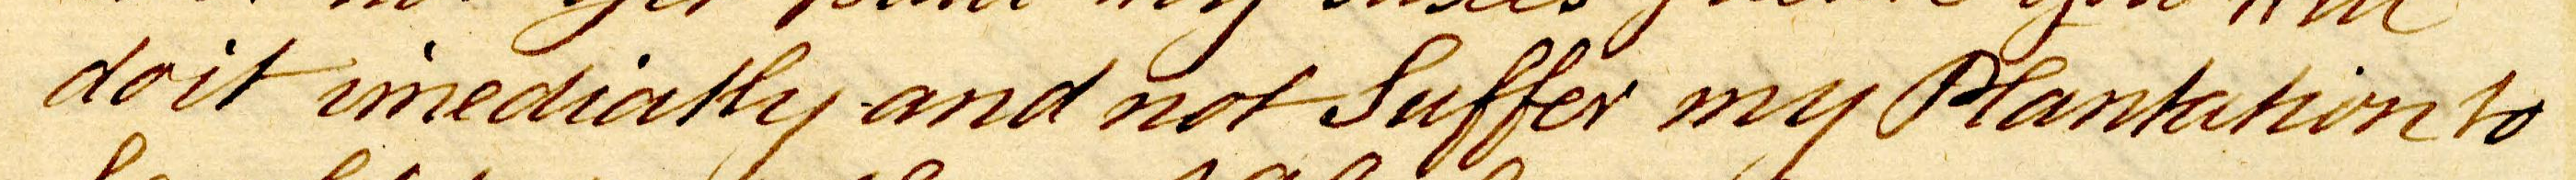doit imedialty and not Suffer my Plantation to
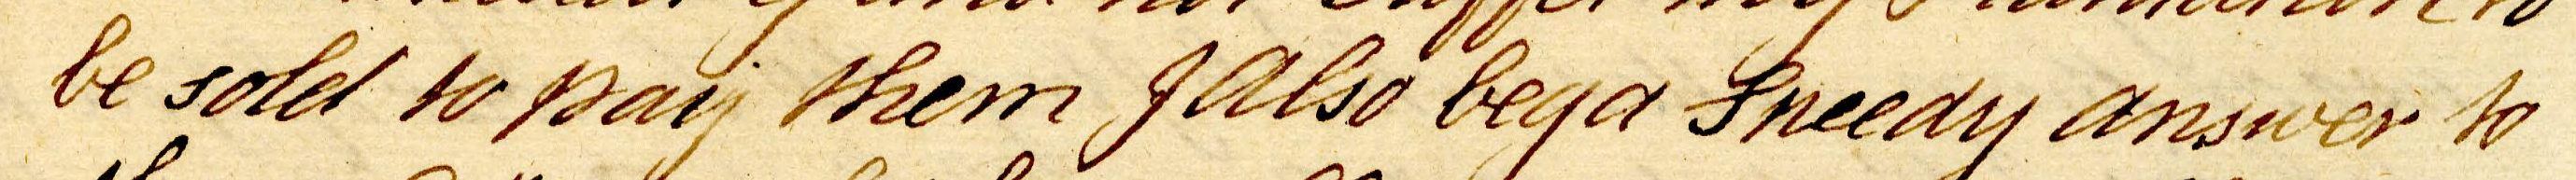be sold to Pay them I Also begd Speedy Answer to
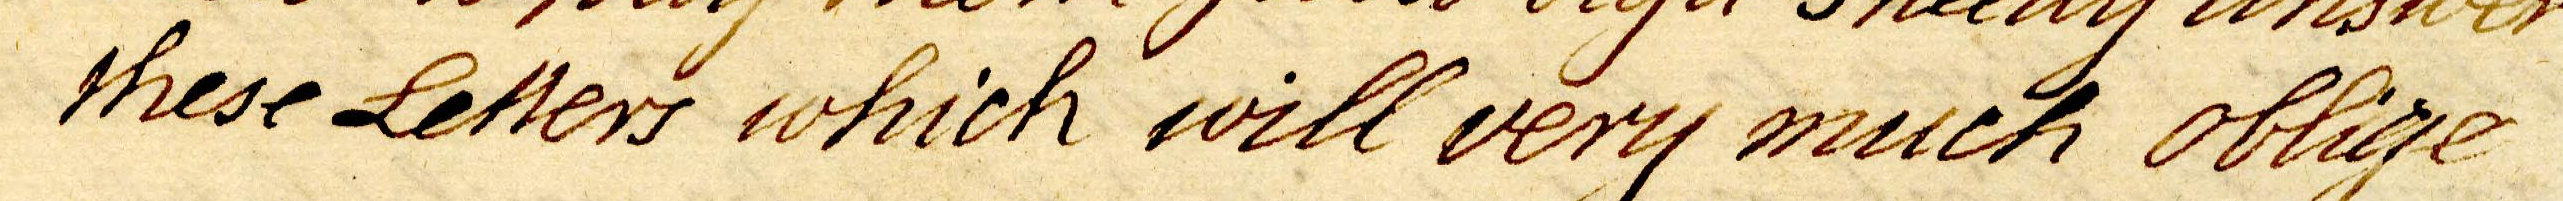these Letters which will very much oblige
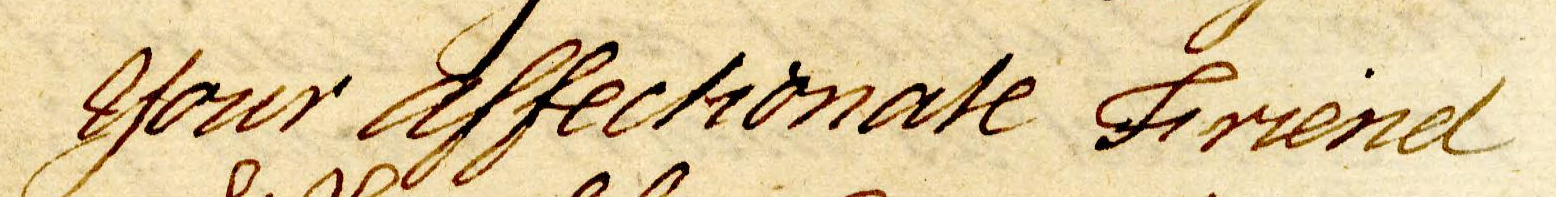Your Affectionate Freind
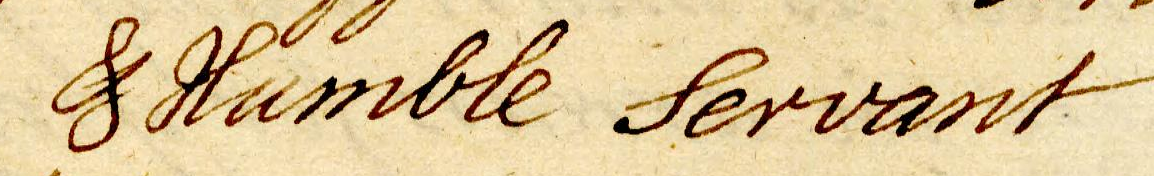& Humble Servant
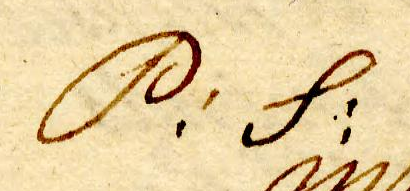P:S:
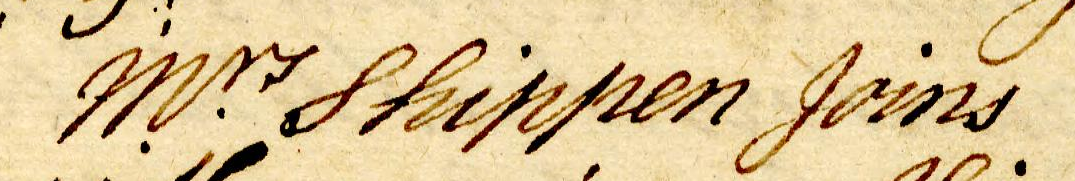M^rs. Shippen Joins
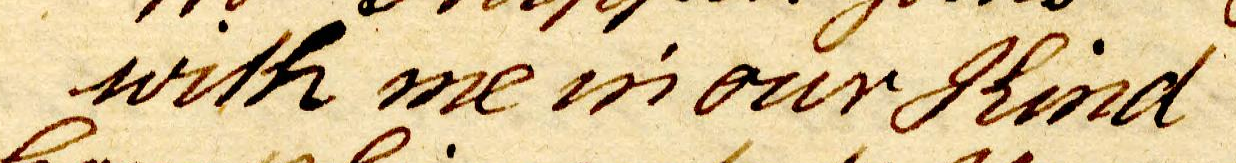with me in our Kind
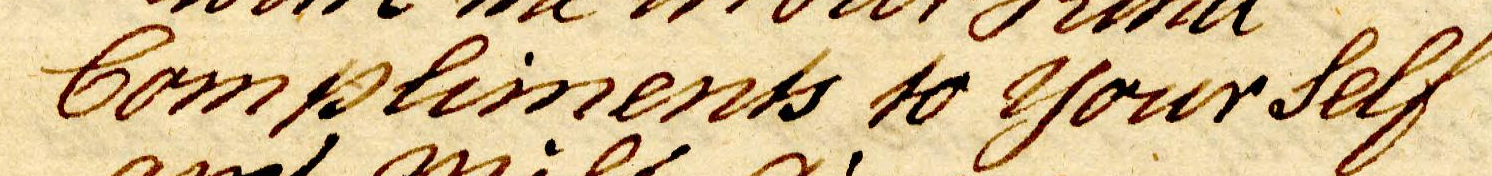Compliments to Your Self
